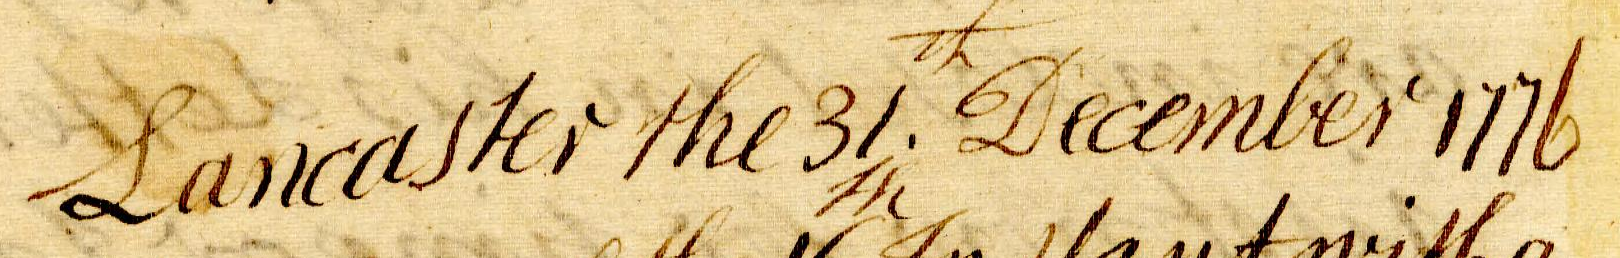Lancaster the 31^th. December 1776
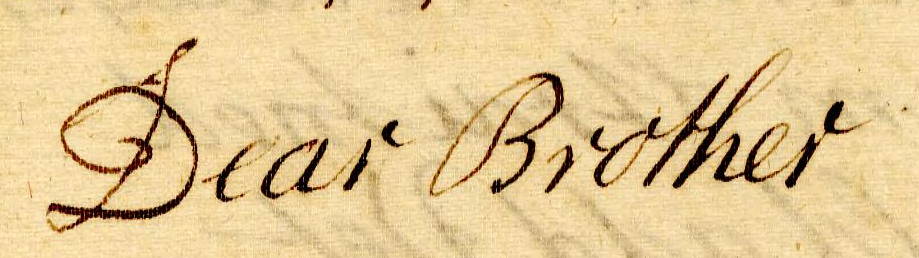Dear Brother
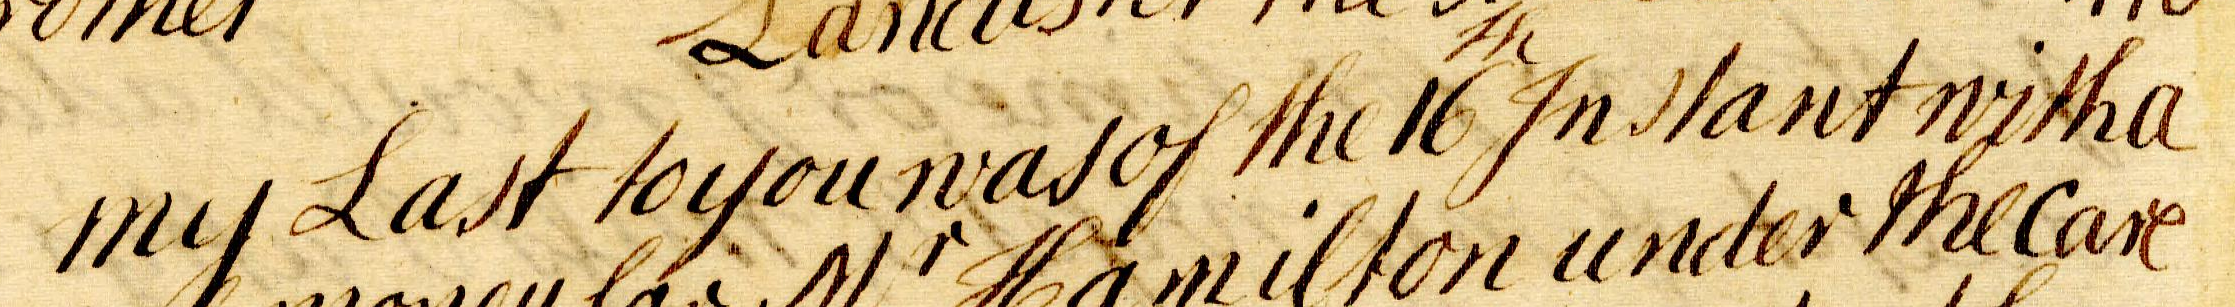My Last to you was of the 16^th Instant with a
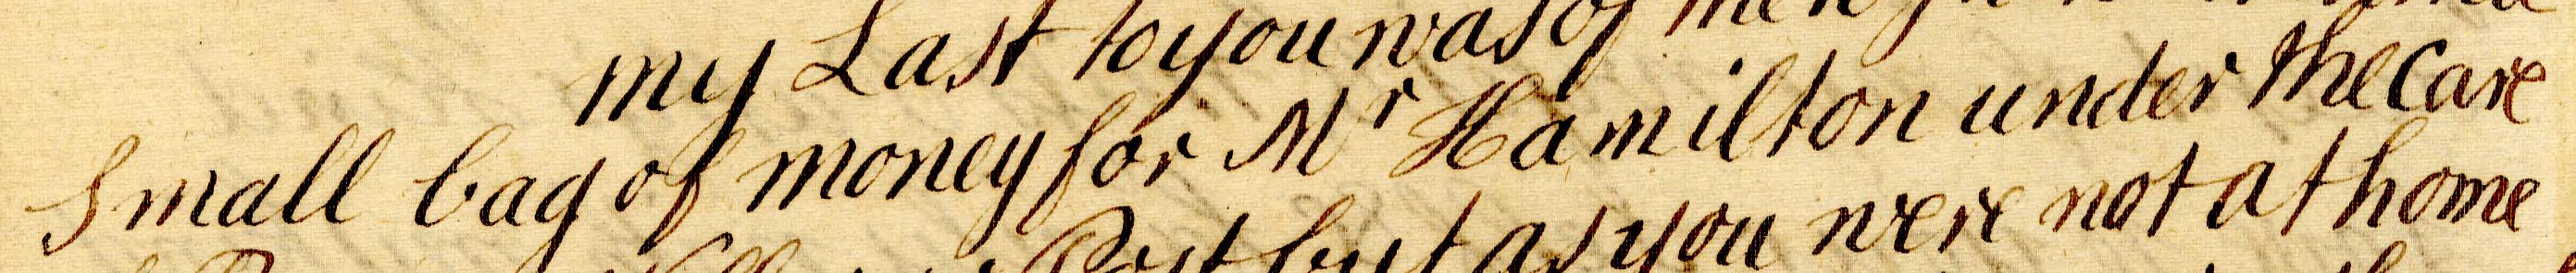Small bag of money for M^r Hamilton under the Care
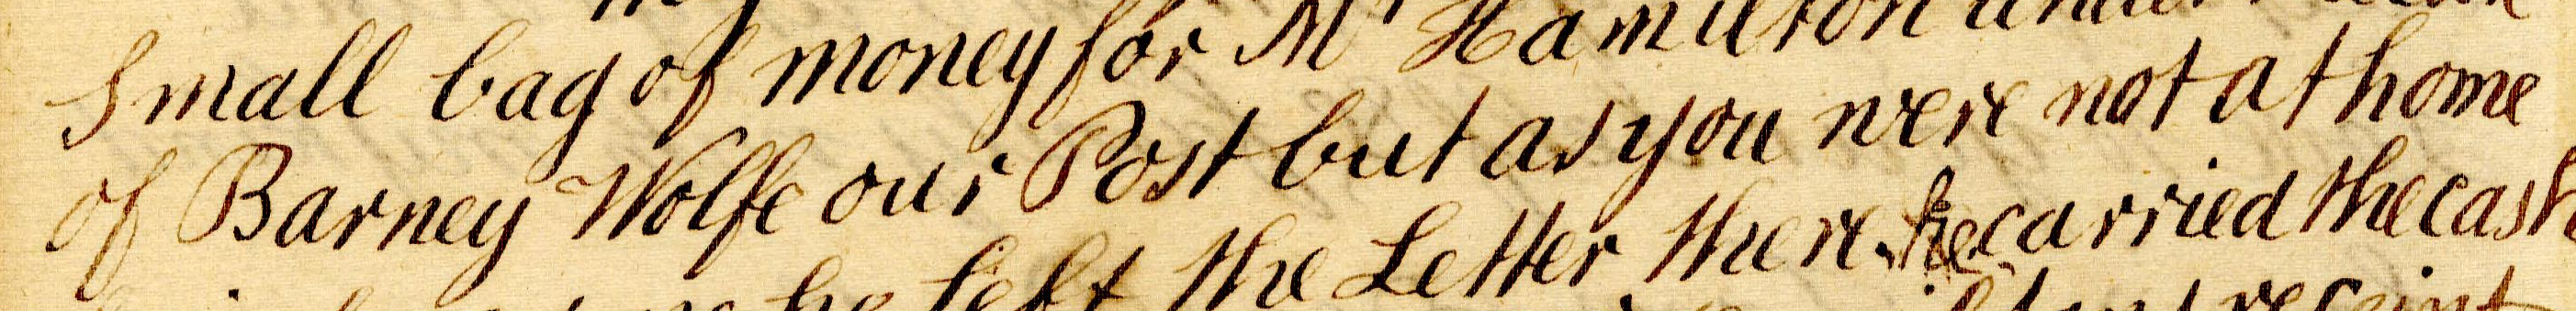of Barney Wolfe our Post but as you were not at home
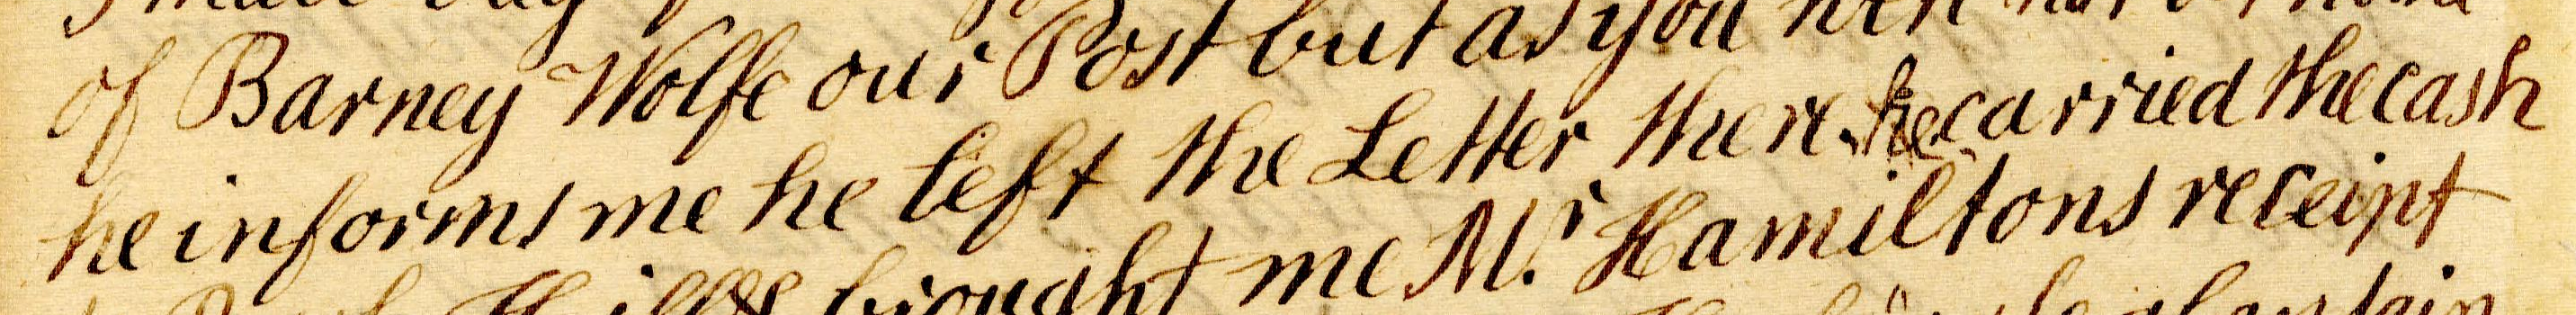he informs me he left the Letter then he carried the cash
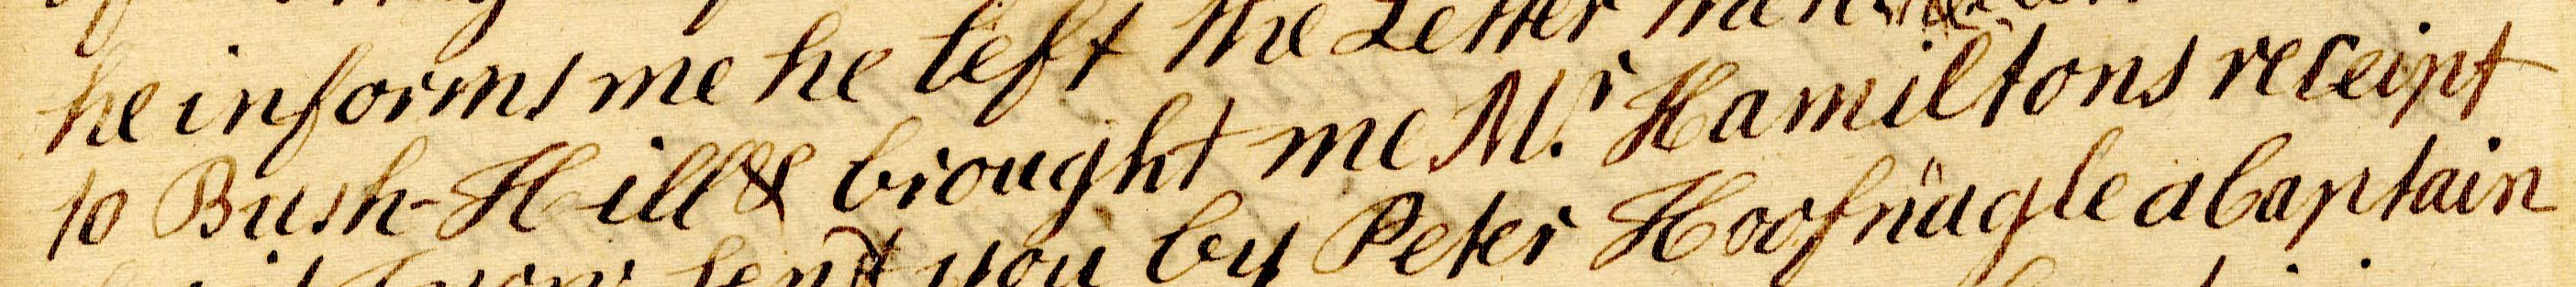to Bush Hill & brought me M^r. Hamiltons receipt
